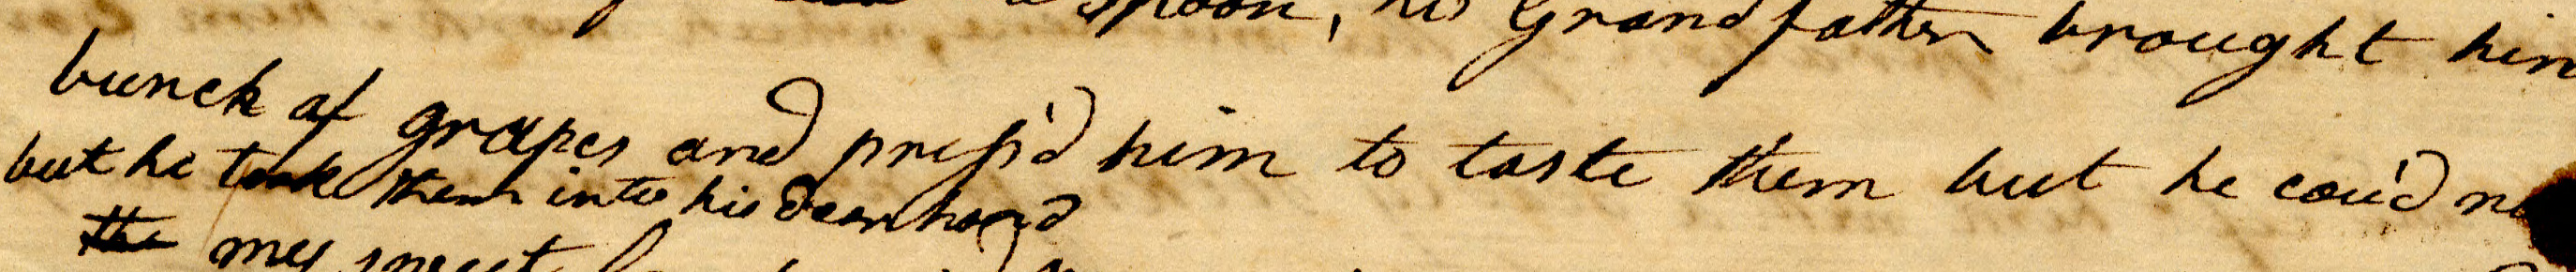bunch of grapes and press'd him to taste them but he cou'd n[_]
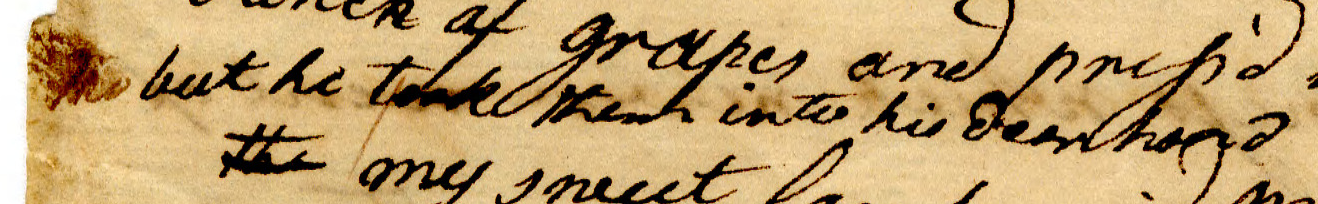but he took them into his dear hand
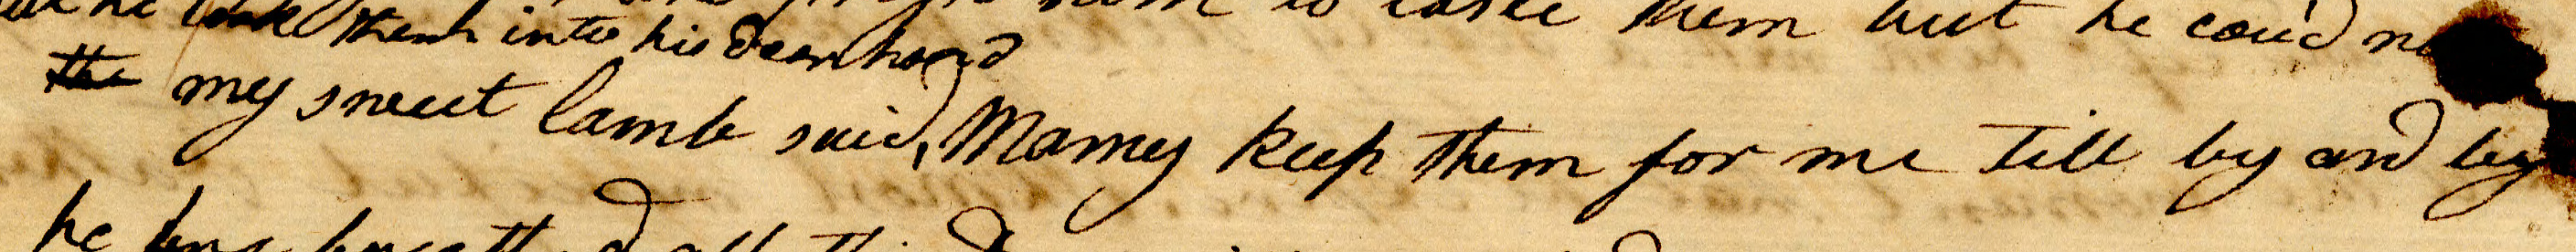[the] my sweet lamb said, Mamy keep them for me till by and by
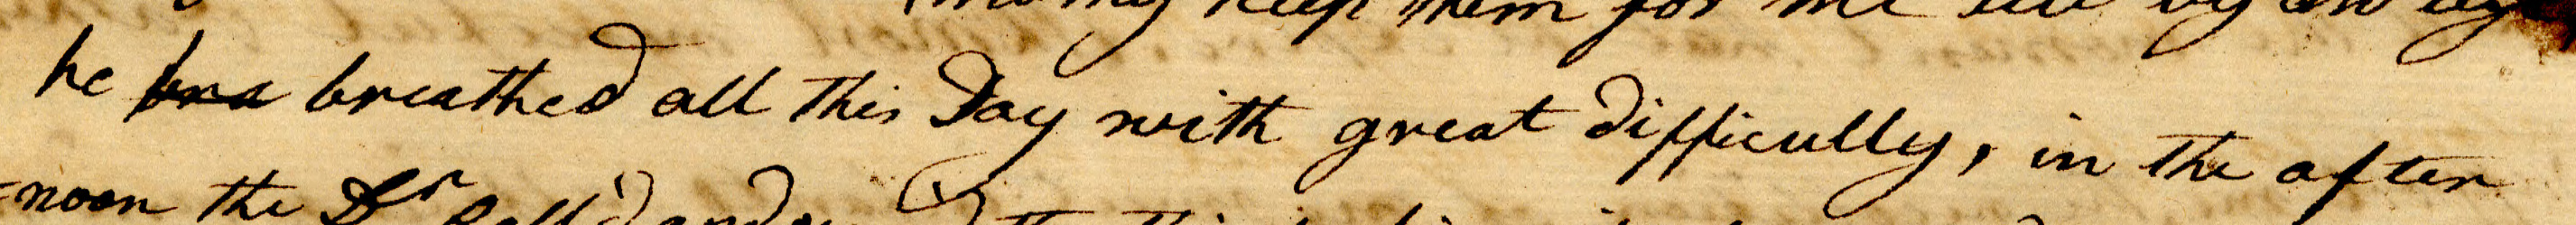he [bra] breathed all this Day with great difficulty, in the after
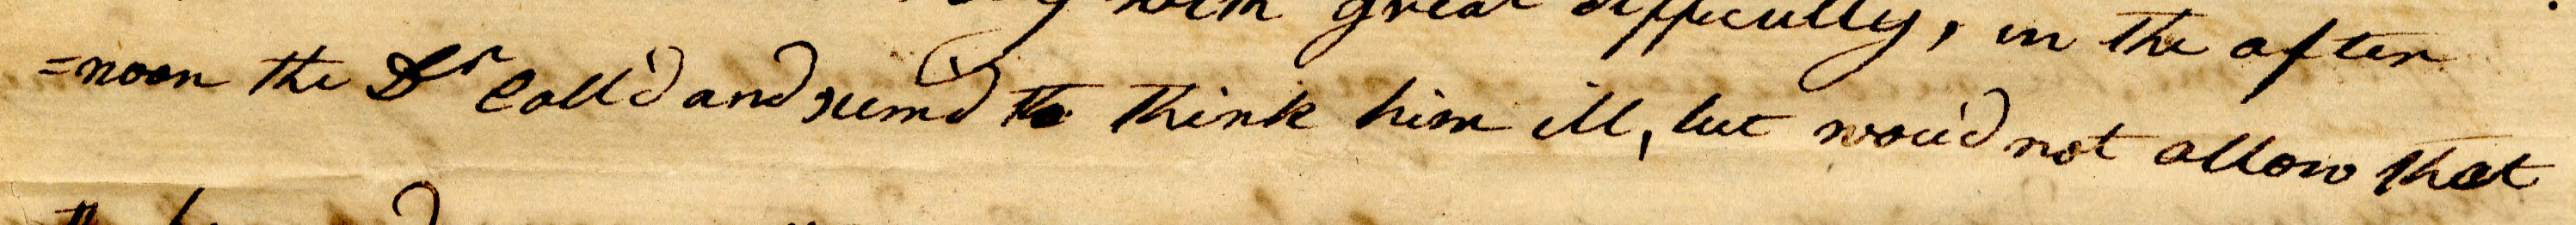=noon the D^r call'd and seem'd to think him ill, but wou'd not allow that
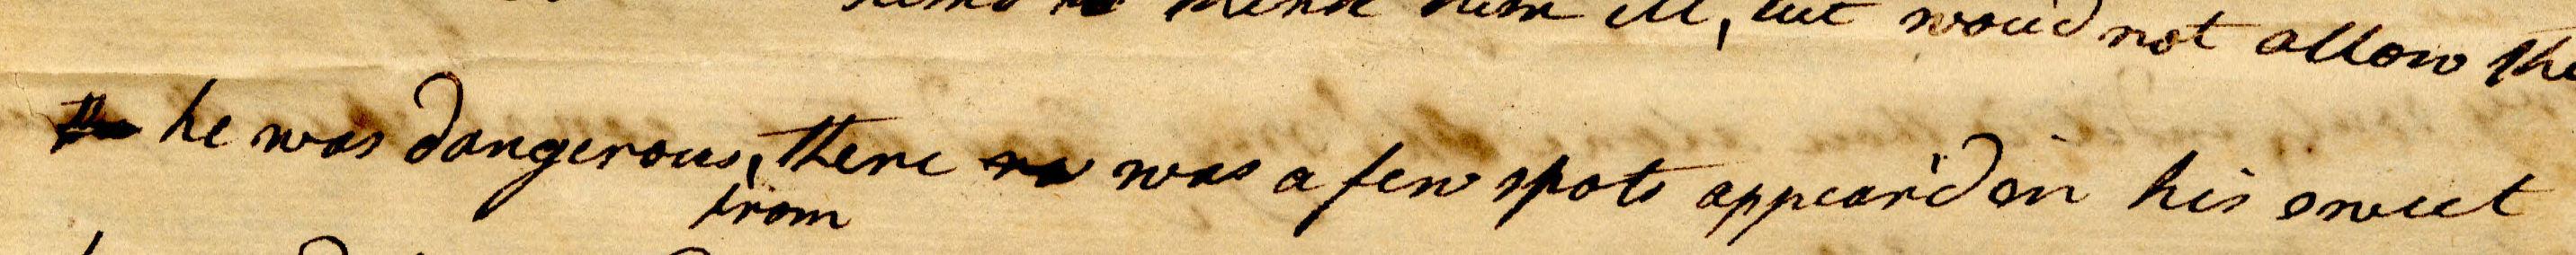[the] he was dangerous, there [ne] was a few spots appear'd on his sweet
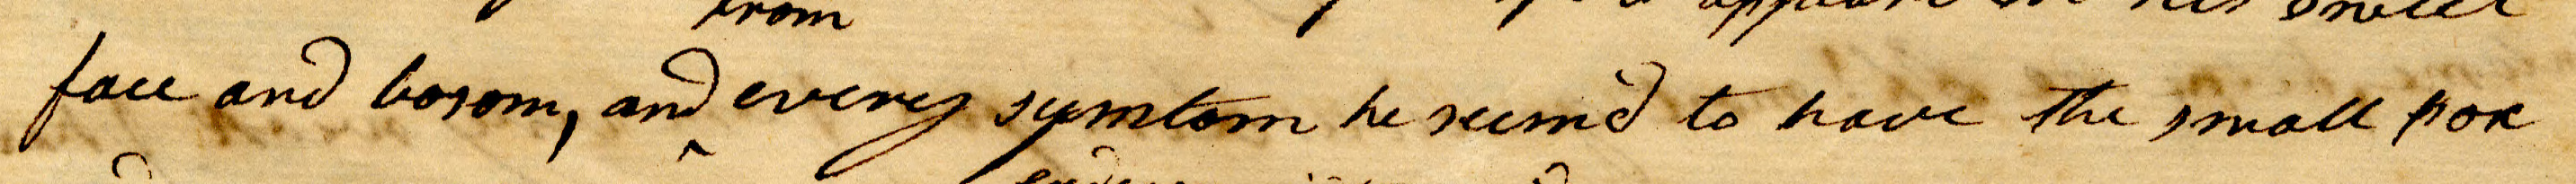face and bosom, and ^ every symtom he seemd to have the small pox
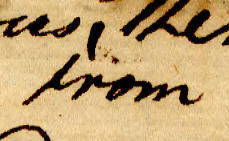from
